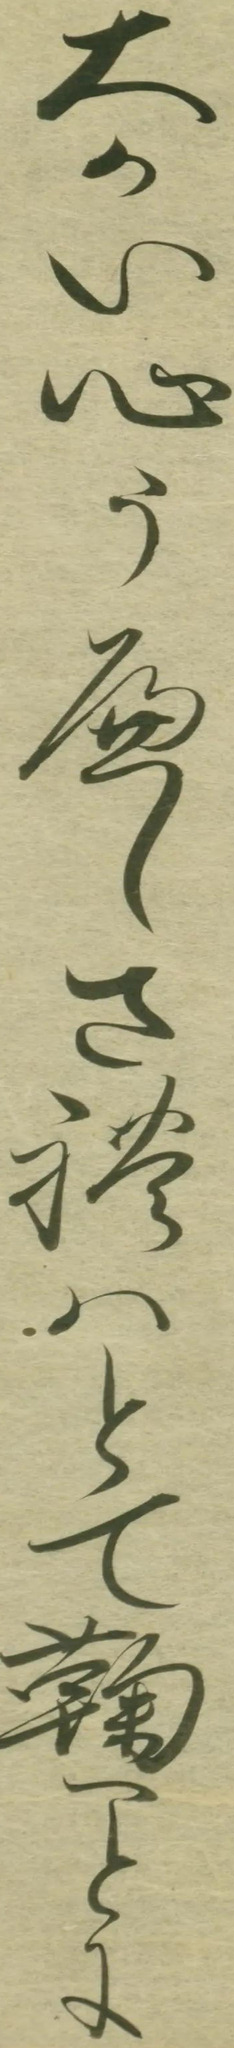大かい心うへしされはとて鞠ことに
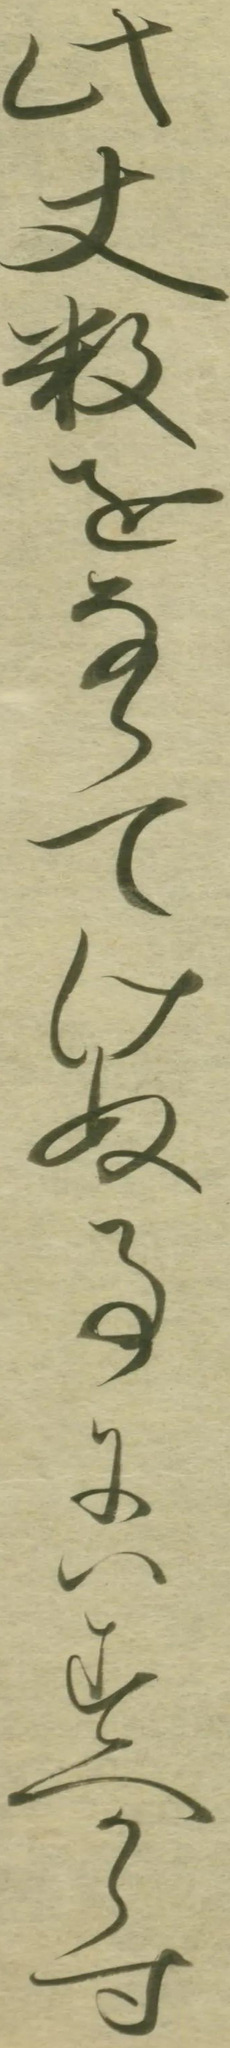此丈数をならてけぬ事にはすへからす
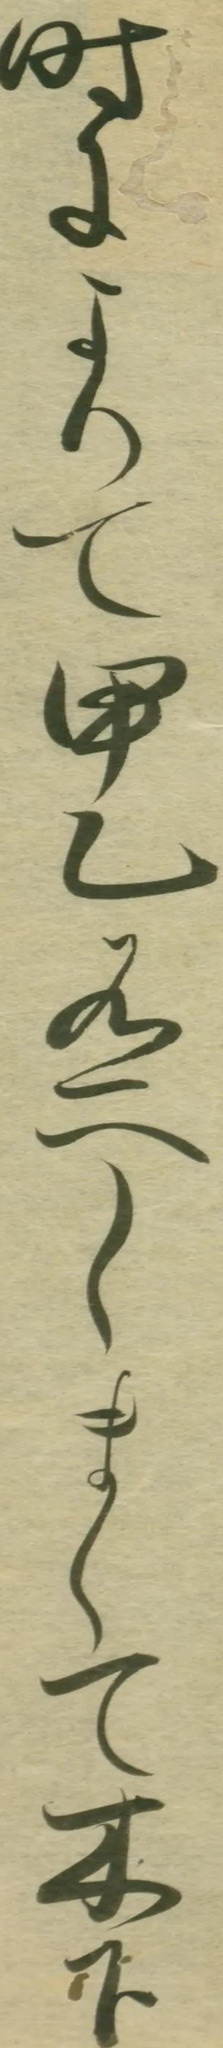時によりて甲乙有へしまして木下
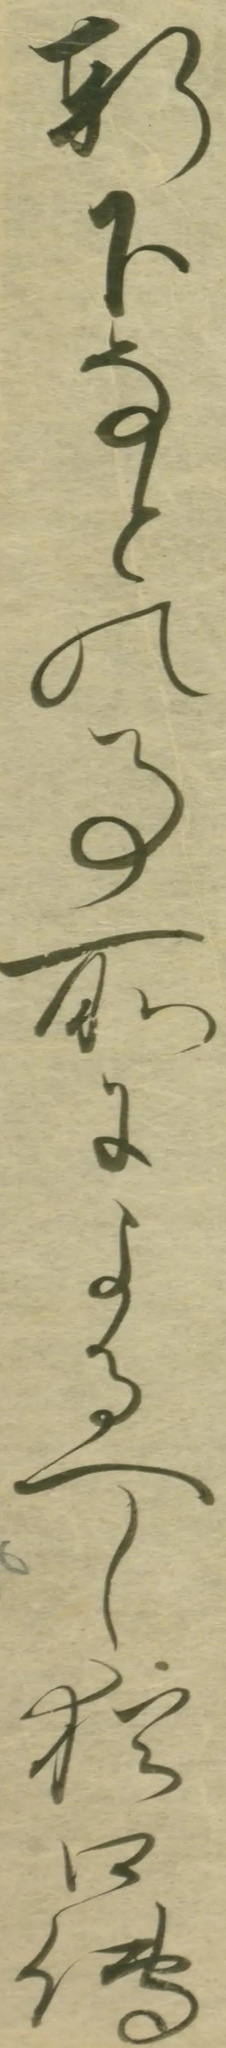軒下なとの事所によるへし猶口伝
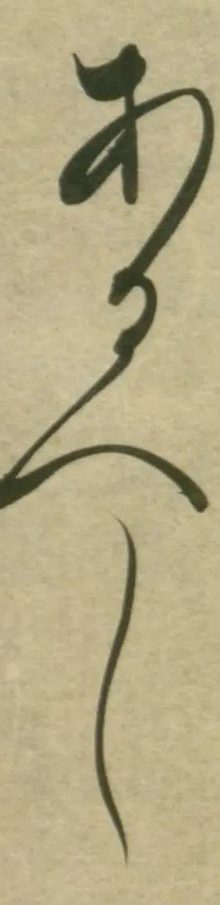あるへし

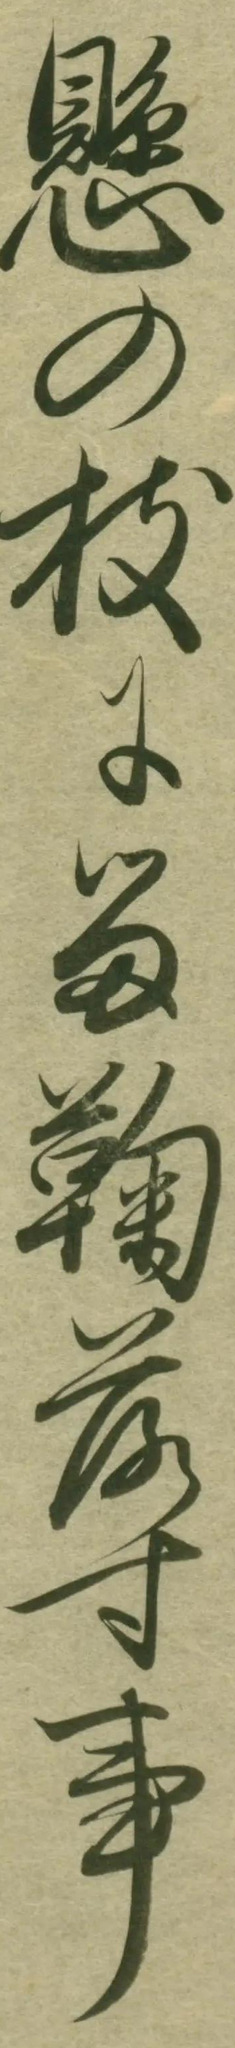一懸の枝に留鞠落す事
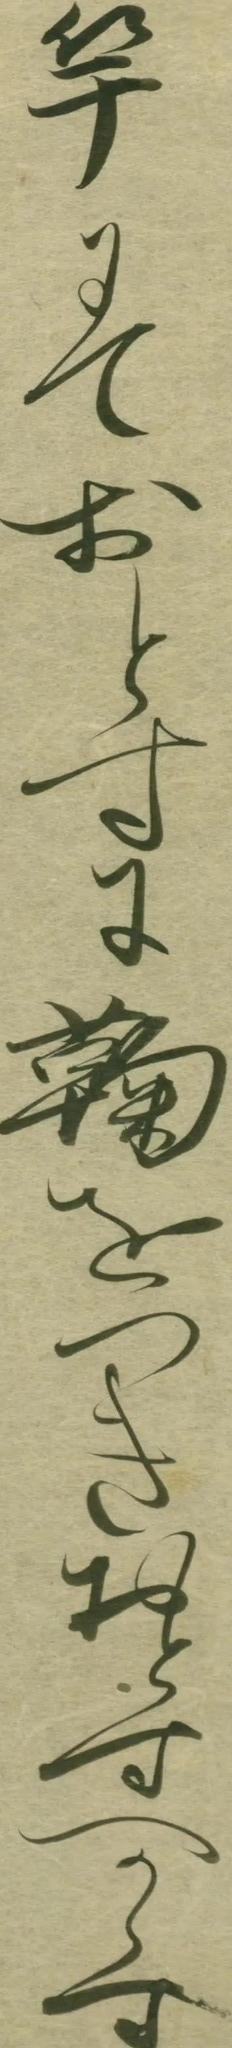竿にておとすに鞠をつきおとすへからす
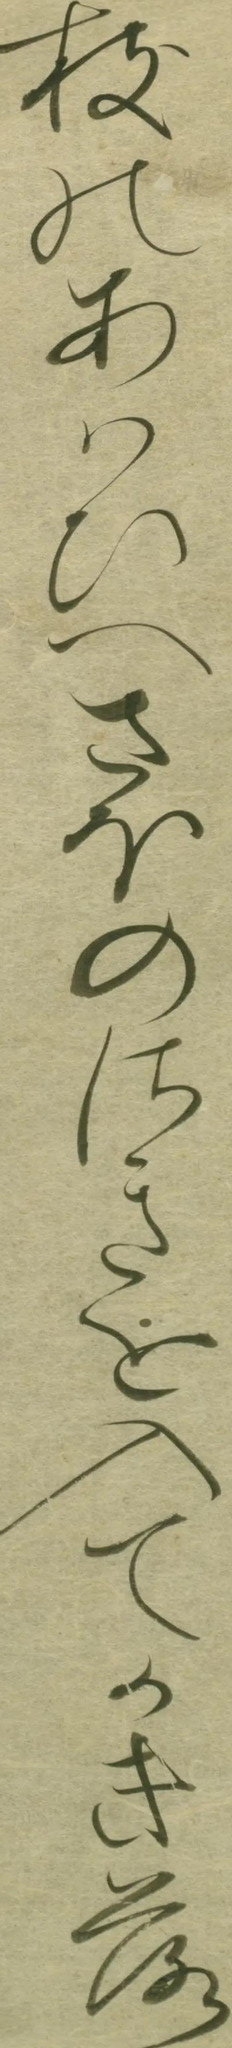枝のあはひへさほのさきを入てかき落
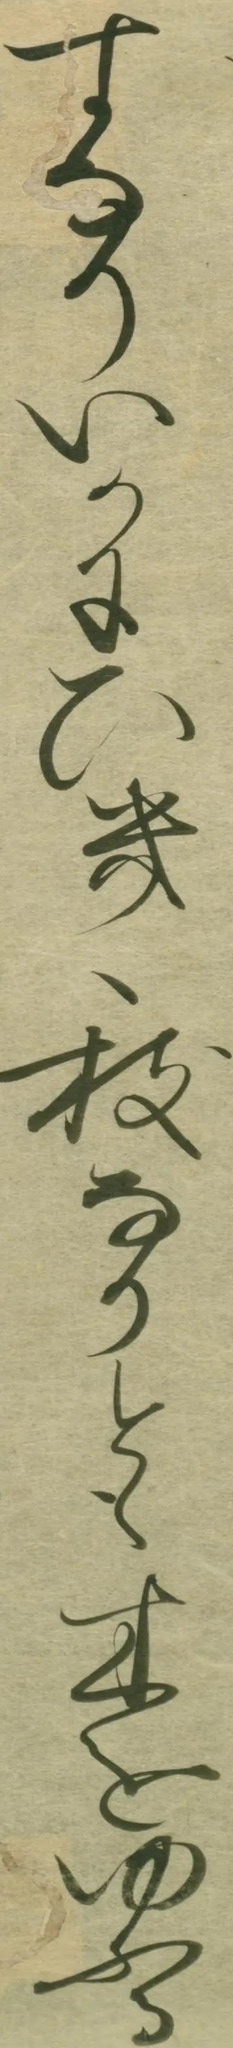すなりいかにひきゝ枝なりとも木をゆふる
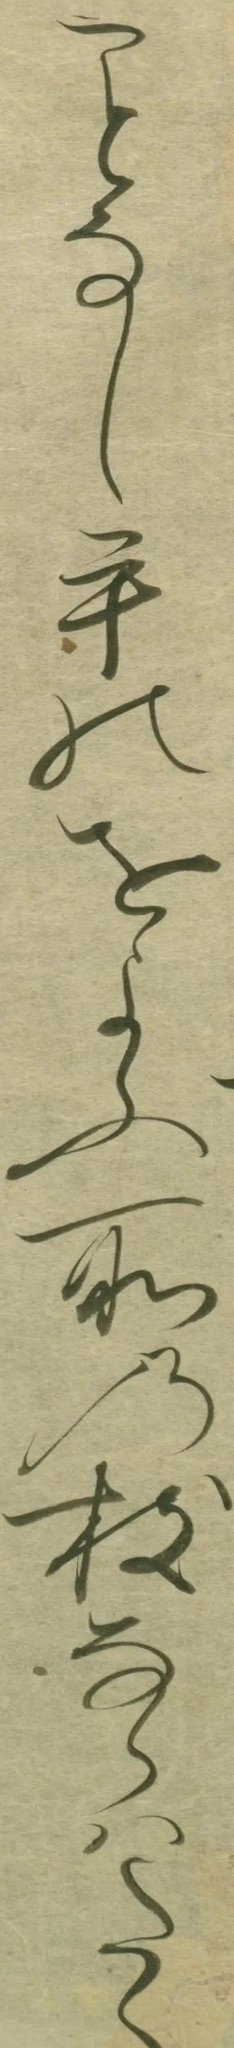ことなし手のをよふ所の枝ならはたゝ
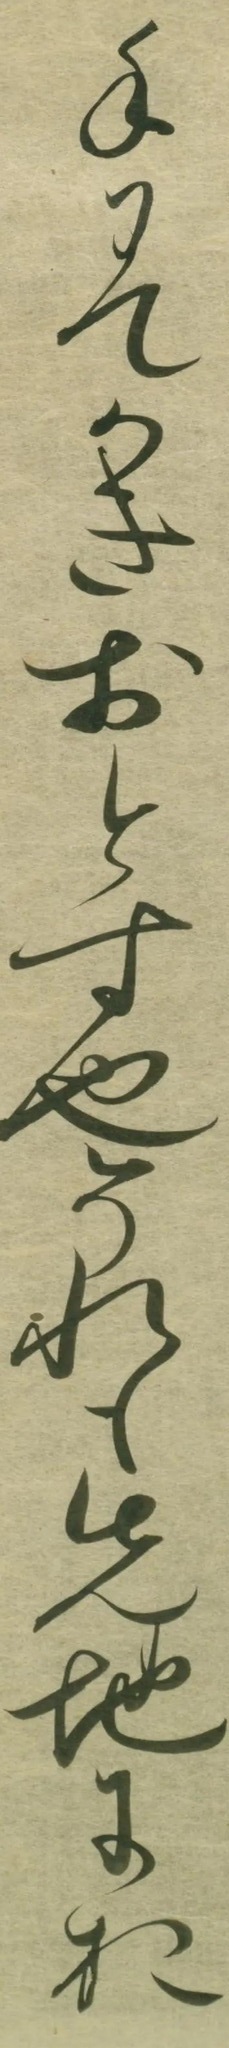手にてかきおとす也それも先地にお
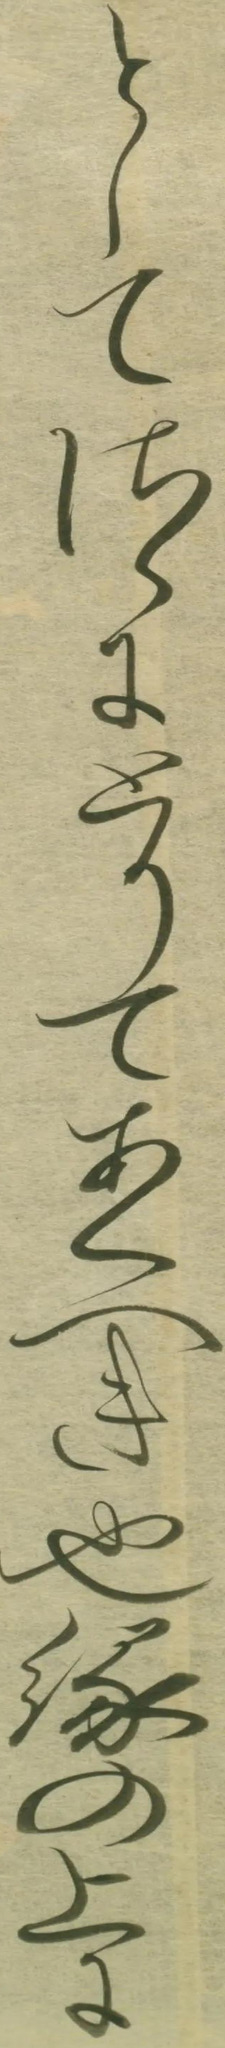としてさらにとりてあくへき也縁の上に
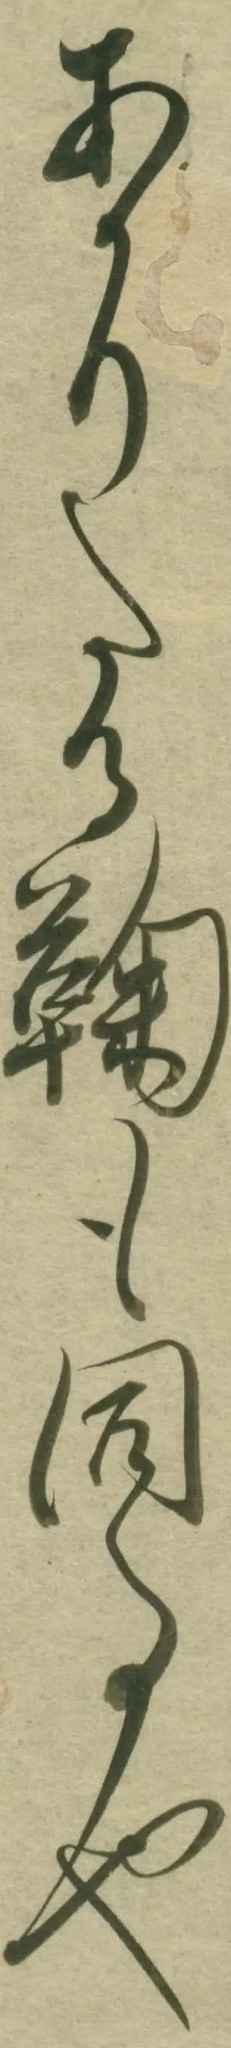あかりたる鞠も同事也
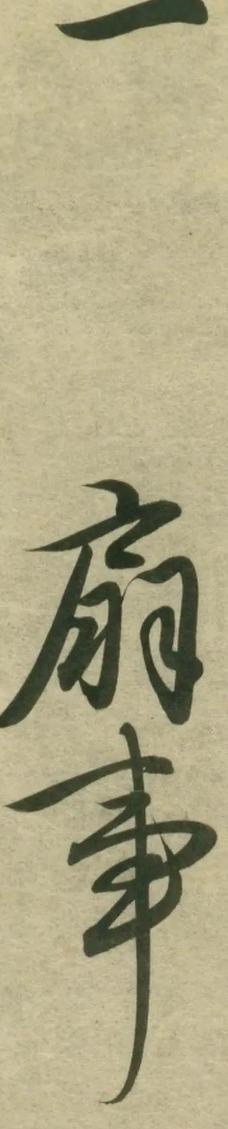一扇事
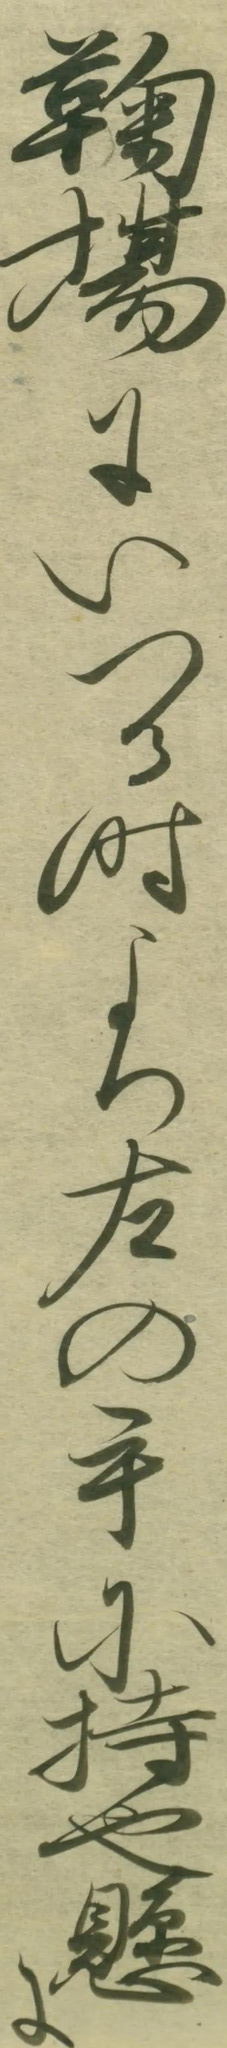鞠場にいつる時より左の手に持也懸に
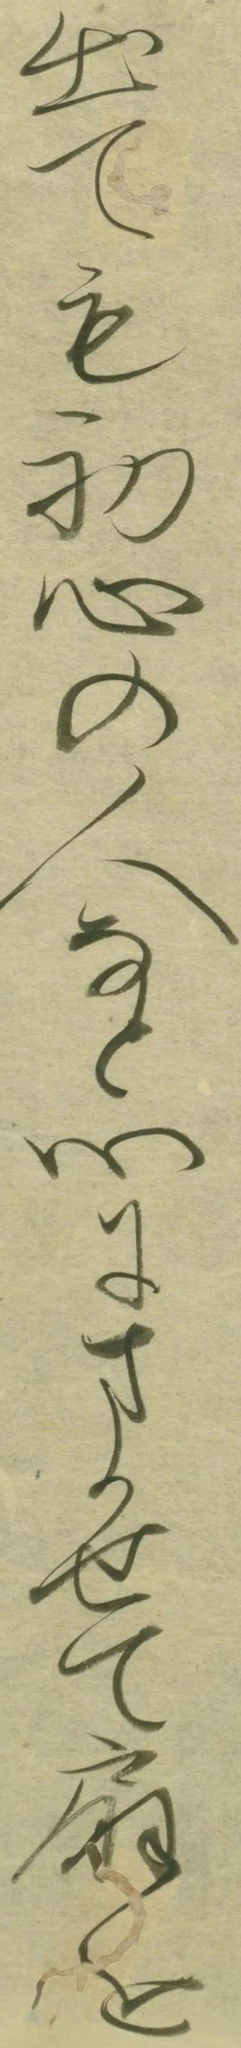出ても初心の人なと心にまかせて扇を
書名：蹴鞠之条々大概
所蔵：国立国会図書館 National Diet Library, JAPAN
